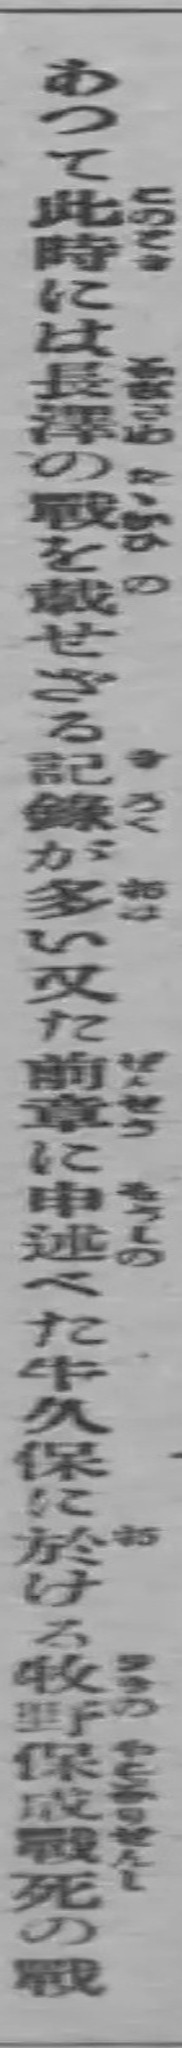あつて此時には長沢の戦を載せざる記録が多い又た前章に申述べた牛久保に於ける牧野保成戦死の戦
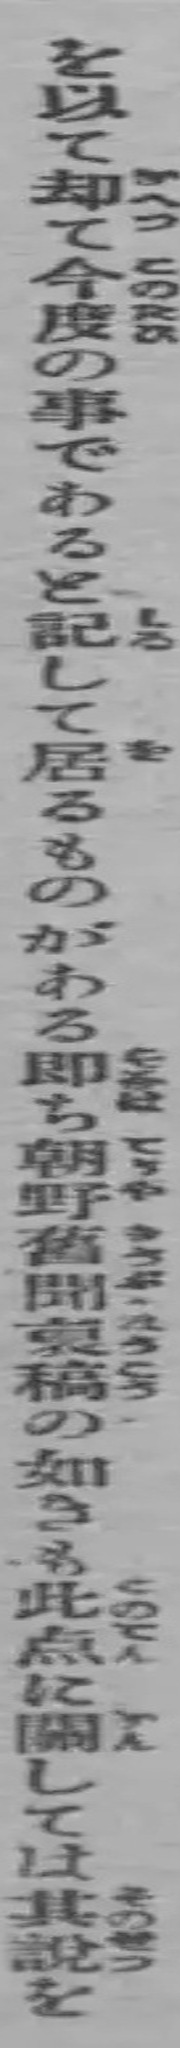を以て却て今度の事であると記して居るものがある即ち朝野旧聞裒稿の如きも此点に関しては其説を
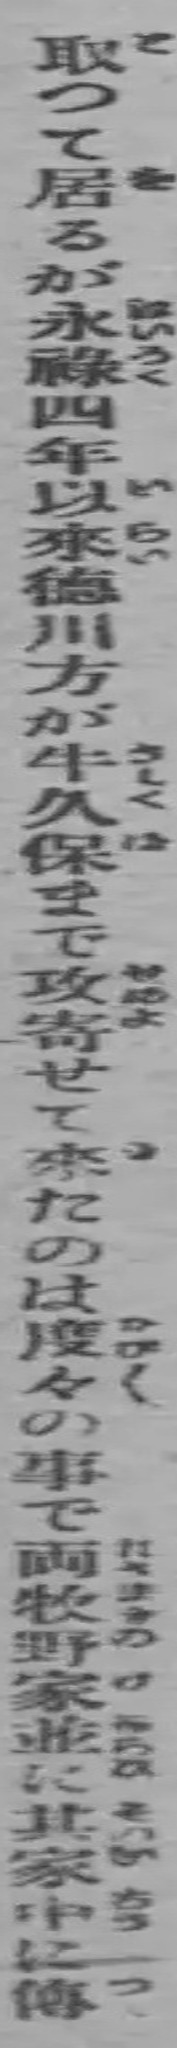取つて居るが永禄四年以来徳川方が牛久保まで攻寄せて来たのは度々の事で両牧野家並に其家中に伝

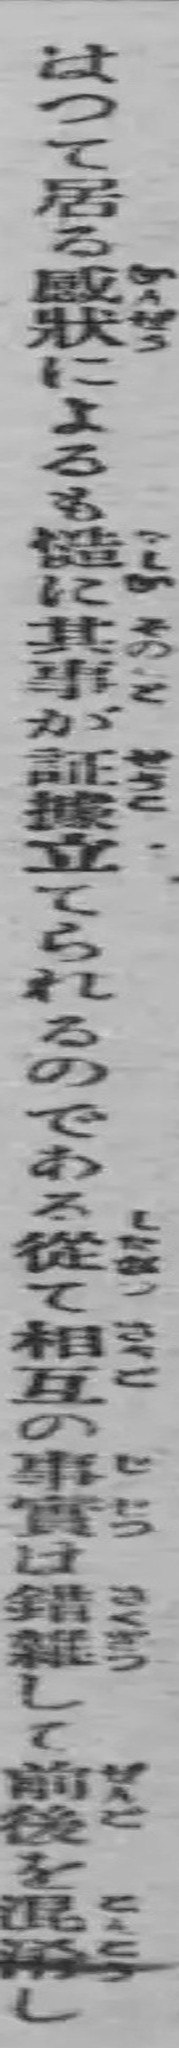はつて居る感状によるも慥に其事が証拠立てられるのである従て相互の事実は錯雑して前後を混淆し
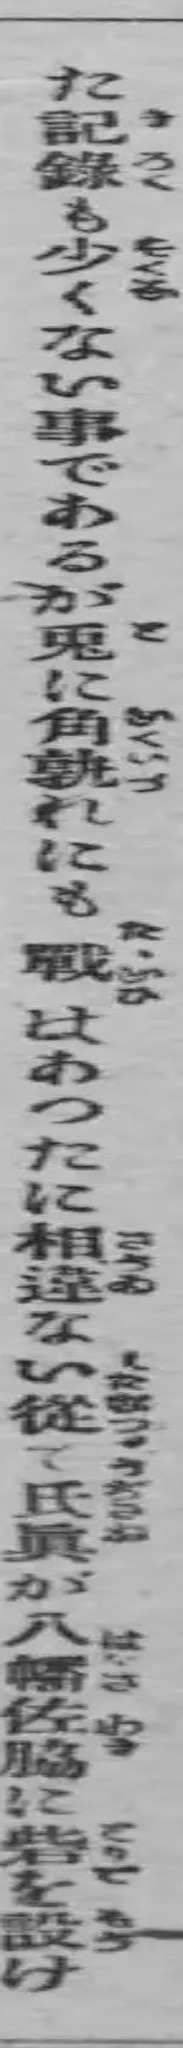た記録も少くない事であるが兎に角孰れにも戦はあつたに相違ない従て氏真が八幡佐脇に砦を設け
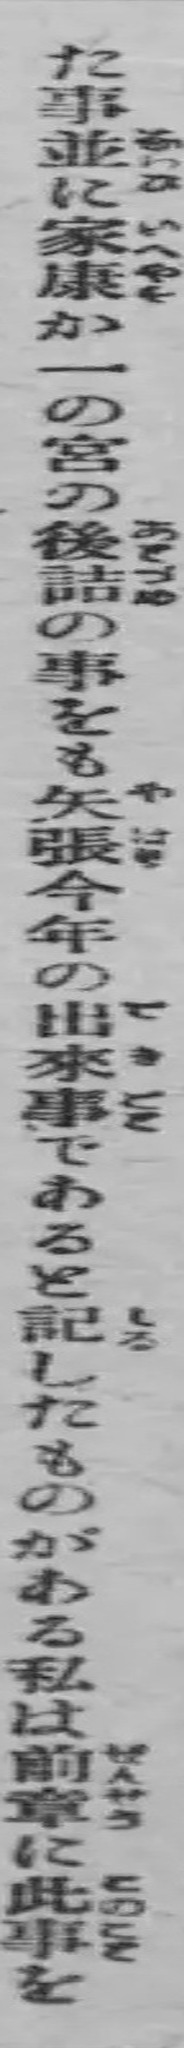た事並に家康か一の宮の後詰の事をも矢張今年ので出来事であると記したものがある私は前章に此事を
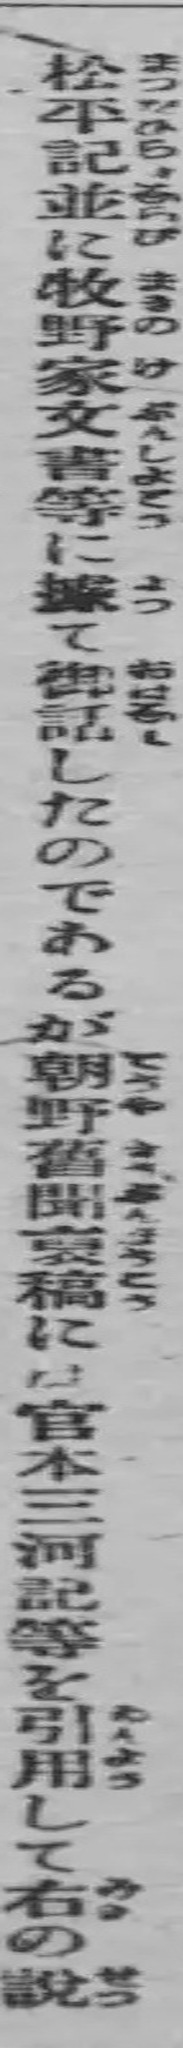松平記並に牧野家文書等に拠て御話したのであるが朝野旧聞裒稿には官本三河記等を引用して右の説
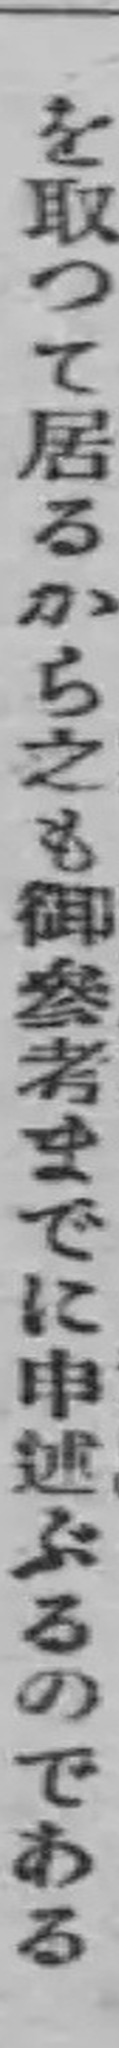を取つて居るから之も御参考までに申述ぶるのである
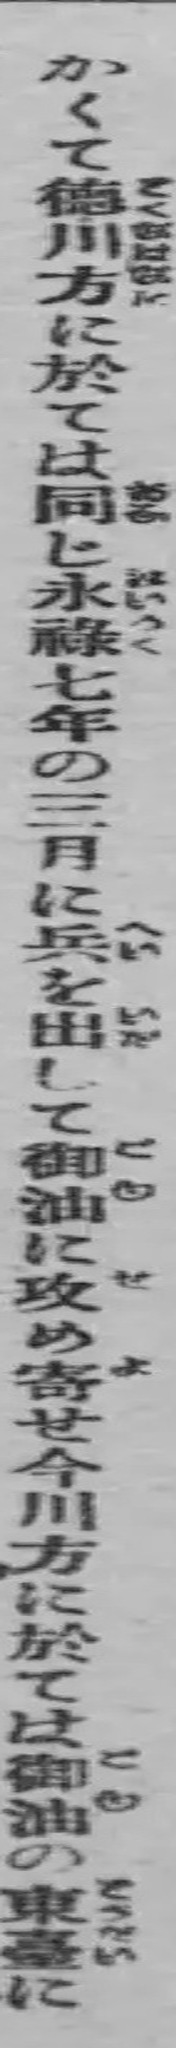御油の戦かくて徳川方に於ては同じ永禄七年の三月に兵を出して御油に攻め寄せ今川方に於ては御油の東台に
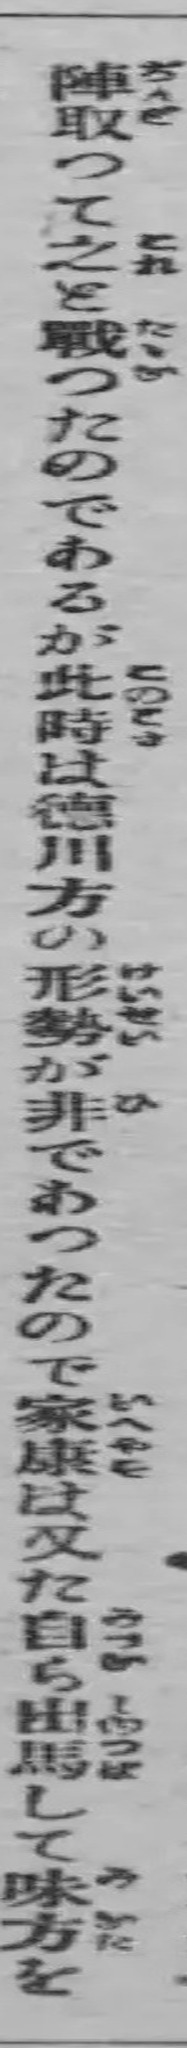陣取つて之と戦つたのであるが此時は徳川方の形勢が非であつたので家康は又た自ら出馬して味方を
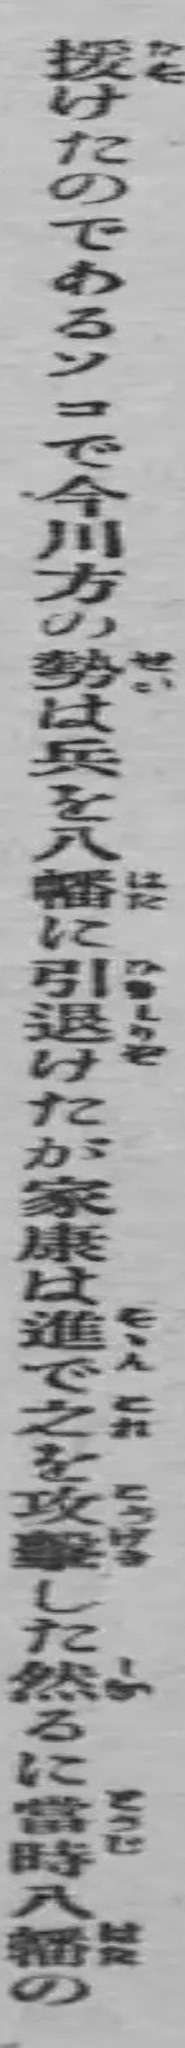八幡の戦援けたのであるソコで今川方の勢は兵を八幡に引退けたが家康は進で之を攻撃した然るに当時八幡の
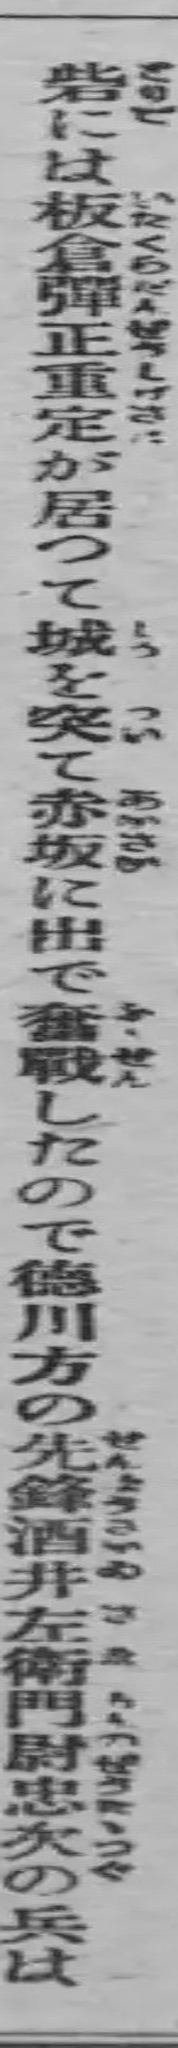砦には板倉弾正重定が居つて城を突て赤坂に出で奮戦したので徳川方の先鋒酒井左衛門尉忠次の兵は
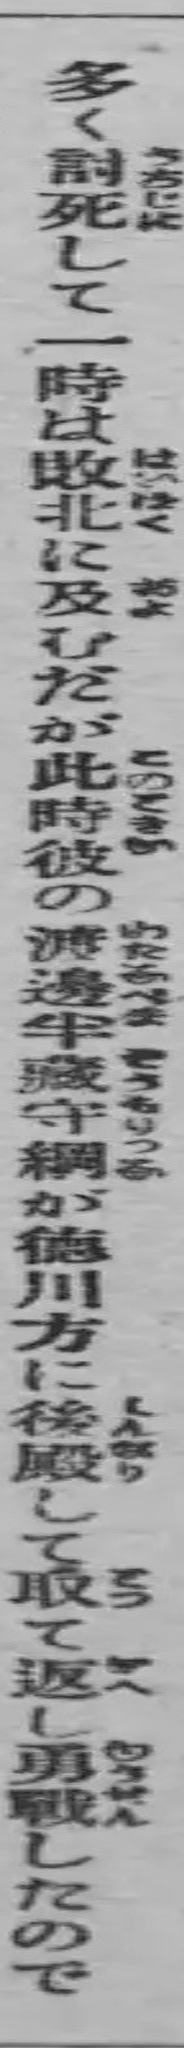多く討死して一時は敗北に及むだが此時彼の渡邊半蔵守綱が徳川方に後殿して取て返し勇戦したので
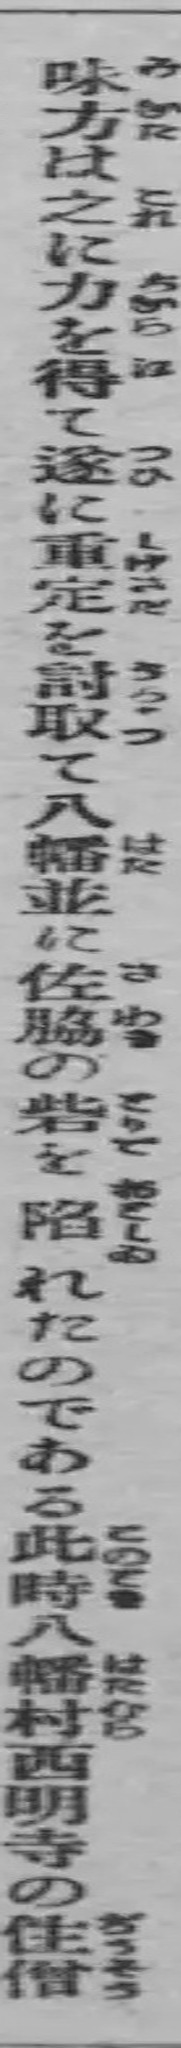味方は之に力を得て遂に重定を討取て八幡並に佐脇の砦を陥れたのである此時八幡村西明寺の住僧
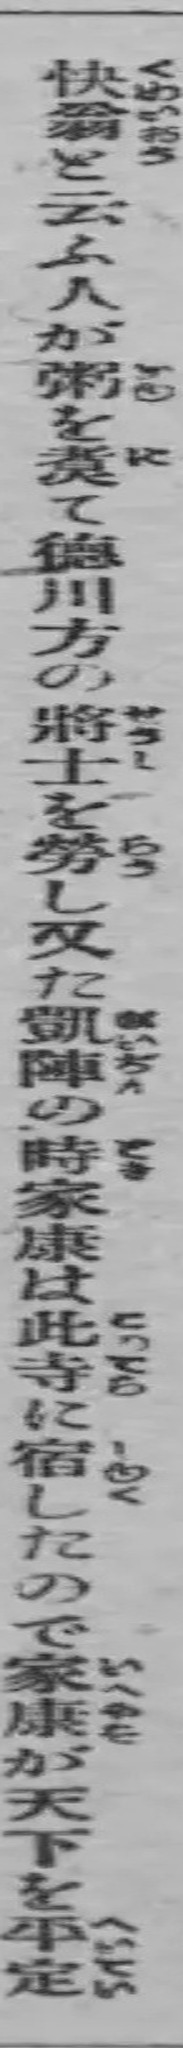快翁と云ふ人が粥を煮て徳川方の将士を労し又た凱陣の時家康は此寺に宿したので家康が天下を平定
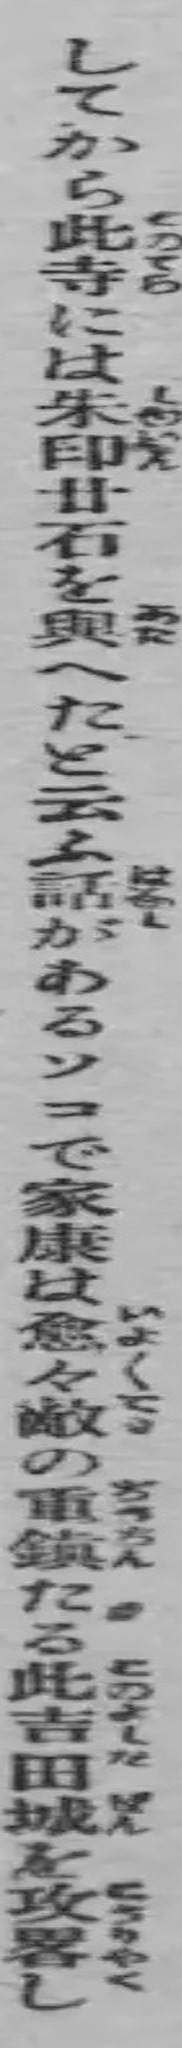してから此寺には朱印廿石を与へたと云ふ話があるソコで家康は愈々敵の重鎮たる此吉田城を攻略し
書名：豊橋市史談
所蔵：国立国会図書館 National Diet Library, JAPAN
